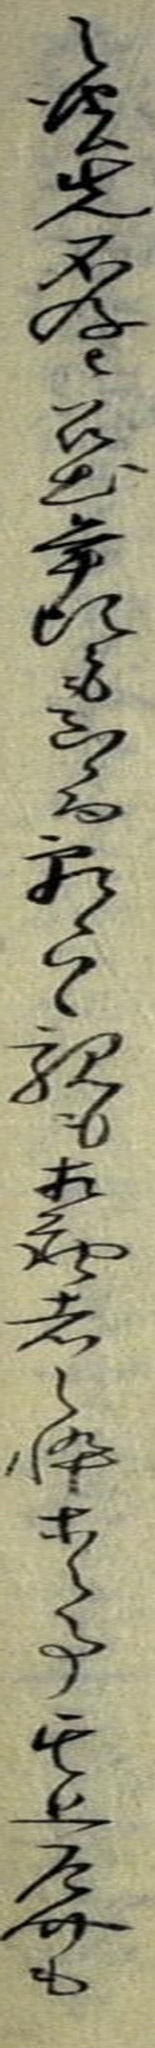之儀ハ先不及被召出年頃ニも至候而願候ハヽ親も相勤候者之忰等之事其上厄介も
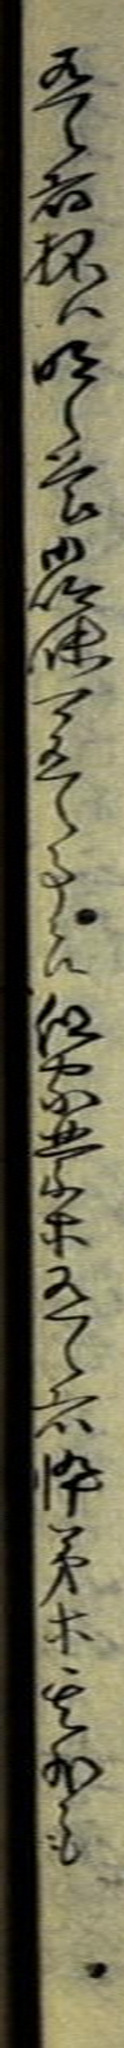有之者抔ハ明之節御吟味可有之事ニ候但家業等有之者忰弟等其他ニも
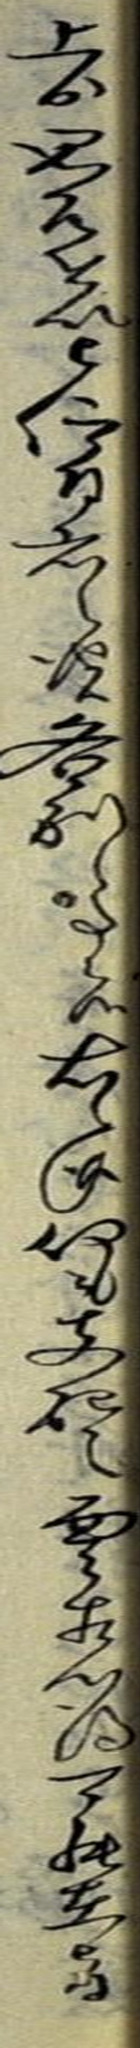上ゟ思召を以被仰付者之儀ハ各別之事ニ候右之趣何も支配之面々相心得可罷在旨
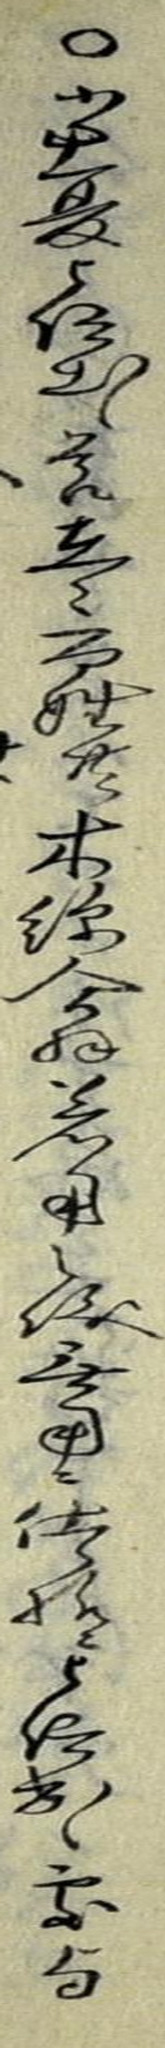〇当夏被仰出候節在々百姓共木綿合羽着用之儀無用ニ仕候様ニ被仰出候処与
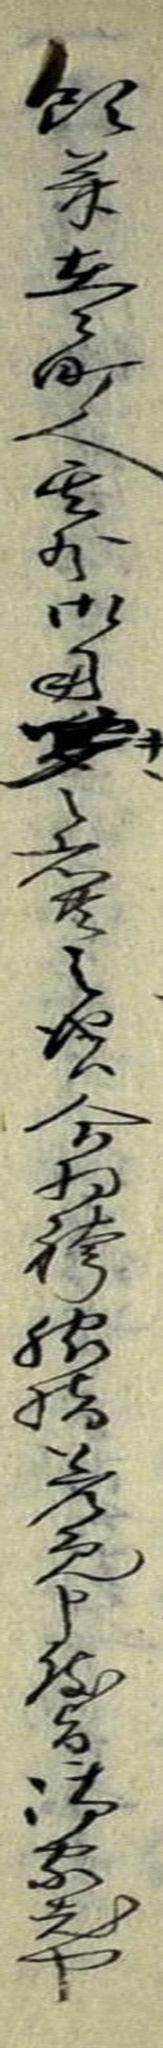頭并在々町人其外御用聞之者共之儀ハ合羽袴脇指差免申度旨御家老中
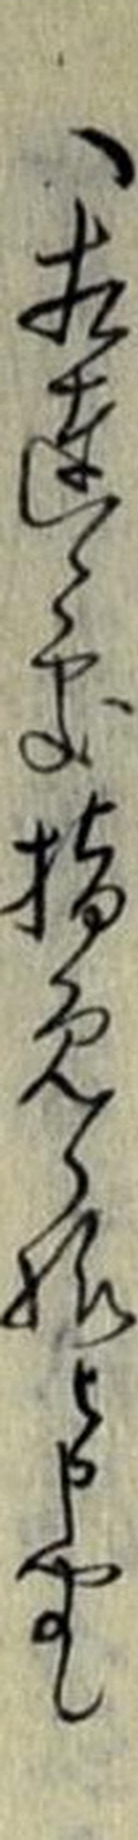へ相達候処指免候様被申聞候
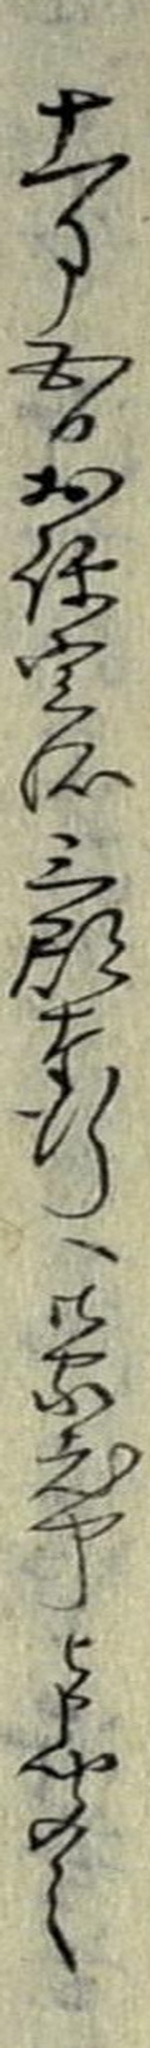十一月五日於評定所三郡奉行へ御家老中被申聞之
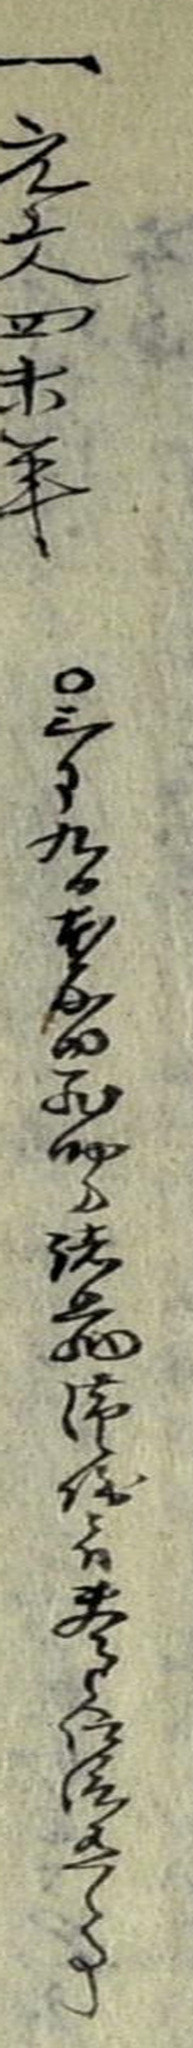一元文四未年〇三月九日本多内蔵助方諸上納滞儀ニ付夫々被仰渡有之事
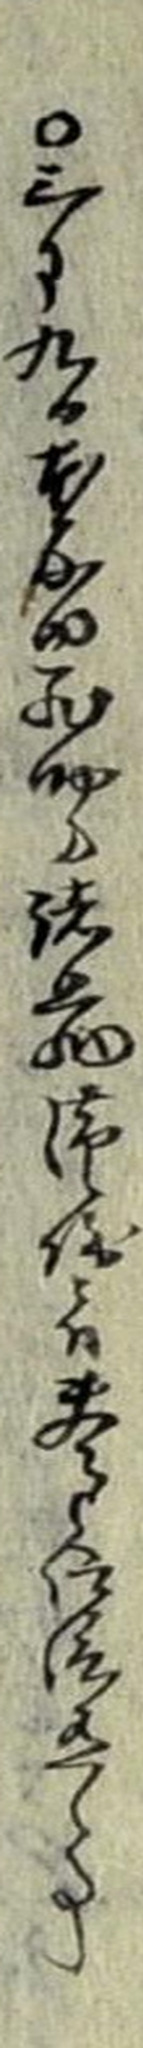一元文四未年〇三月九日本多内蔵助方諸上納滞儀ニ付夫々被仰渡有之事
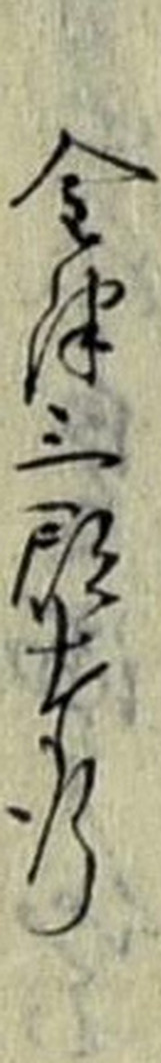金津三郡奉行
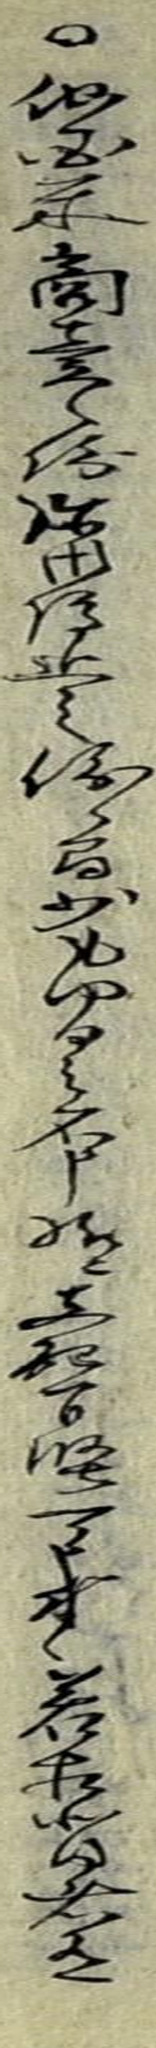〇他国米商売之儀弥御停止之儀候間少もゆるみ不申様ニ支配下堅可申付候若相背者有
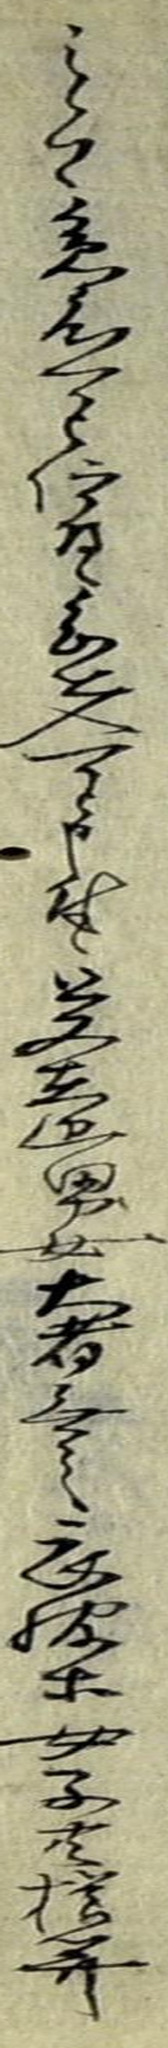之候ハヽ急度可被仰付候念を入可被申付候且又在辺男女奢無之衣服等女子共櫛笄
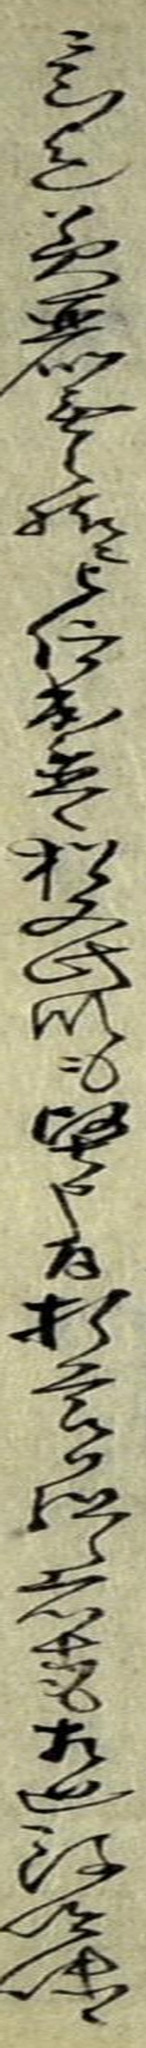ニ至迄美麗無之様ニ被仰出置候猶又此段も堅申付折節ハ組之者等も相廻致吟味候
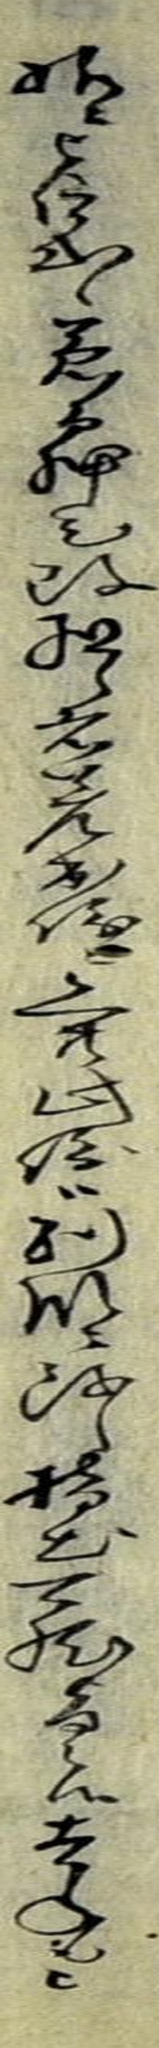様ニ被仰出候兼而押改組之者差出儀ニ候へ共此儀ハ別段ニ致し指出可然旨ニ候去年も被
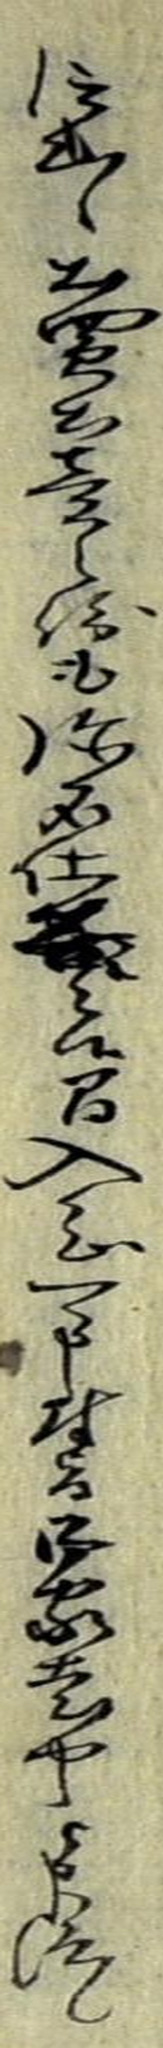仰出候出買出売之儀も弥不仕筈ニ候間入念可申付旨御家老中被申渡候

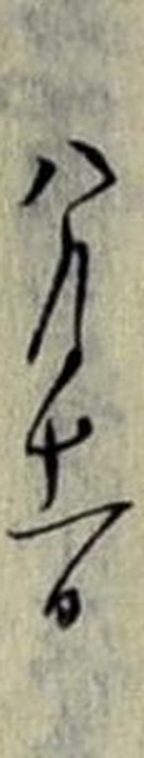八月十一日
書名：命令之部 一
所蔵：福井県文書館 Fukui Prefectural Archives
